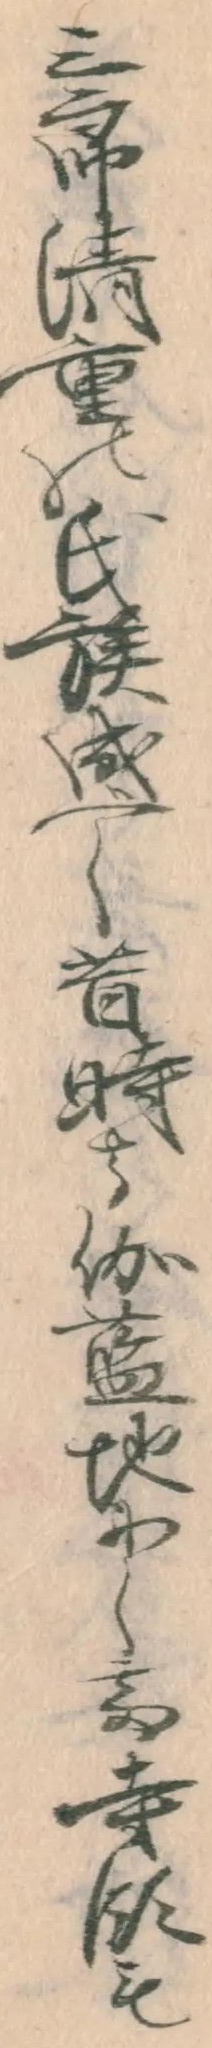三郎清重の氏族成べし昔時は伽藍地にして寺領も
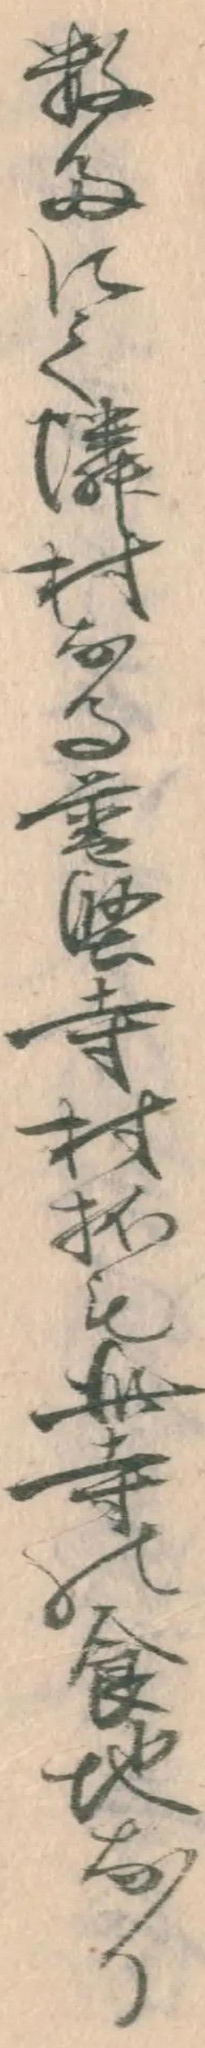数多にて隣村なる普堅寺村抔も此寺の食地なり
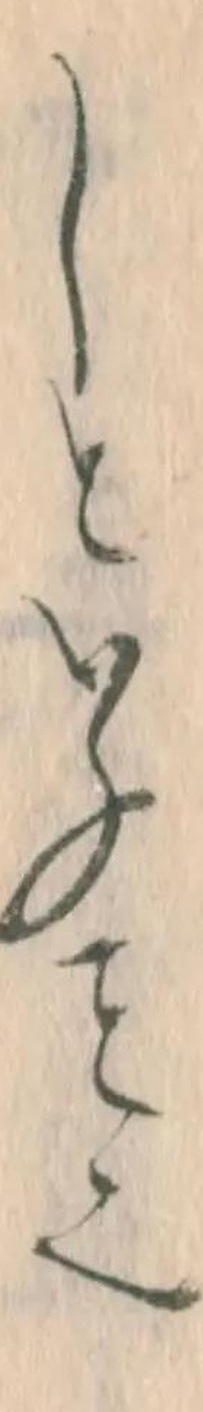しといふこと也
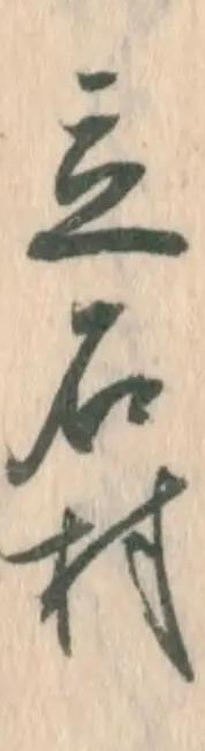立石村
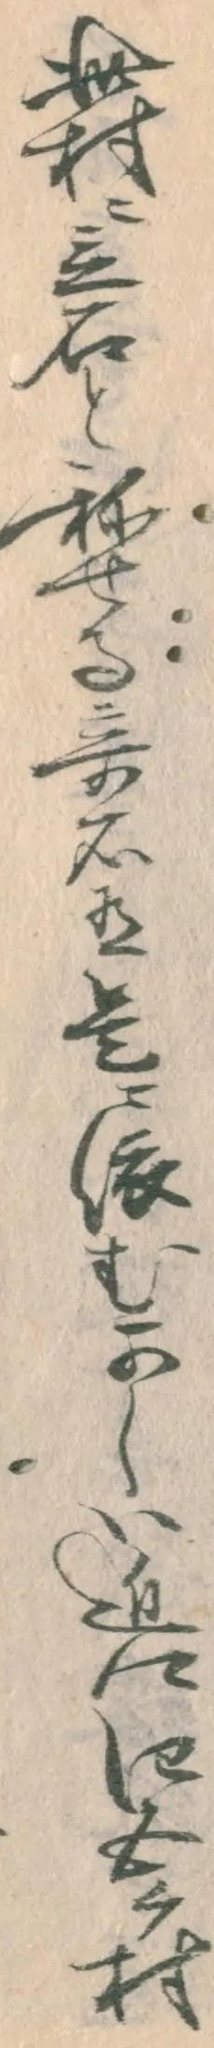此村に立と称せる奇石有是に依むかしは近郷四五ヶ村
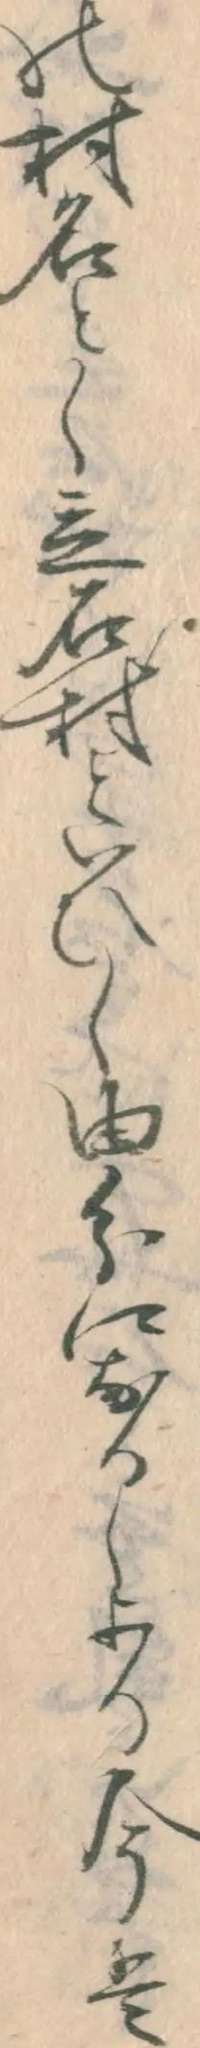の村名とし立石村といひく由分郷なりしより今は

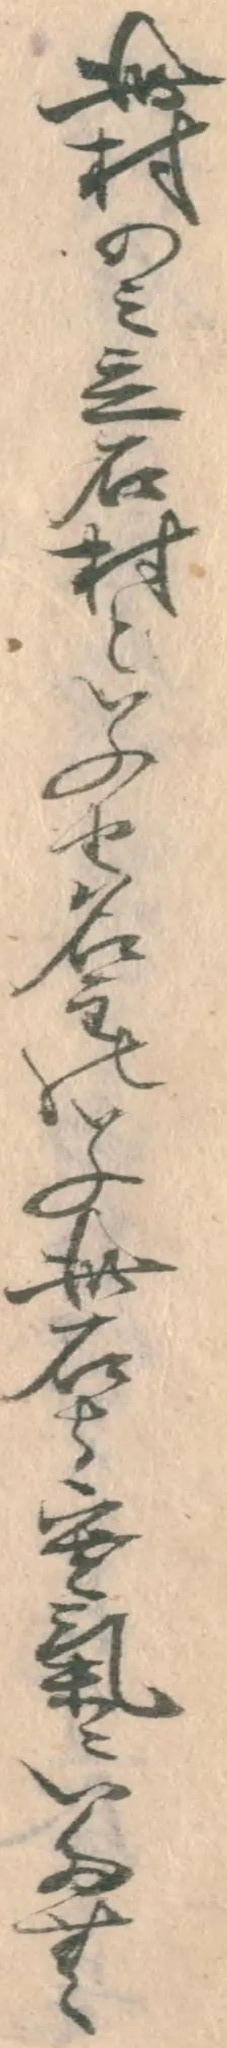此村のみ立石村といふ也名主のいふ此石は寒気にいたむ
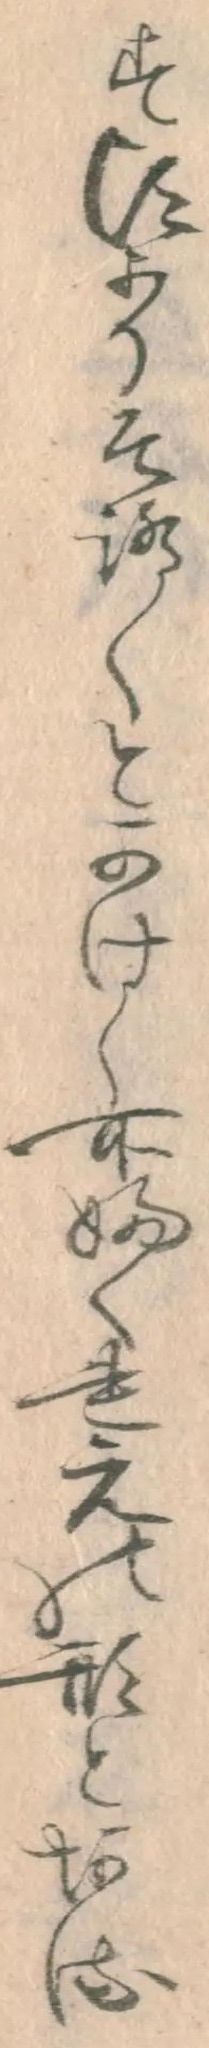す頃よりそろ〳〵とかけし所ふくれ元の形となる
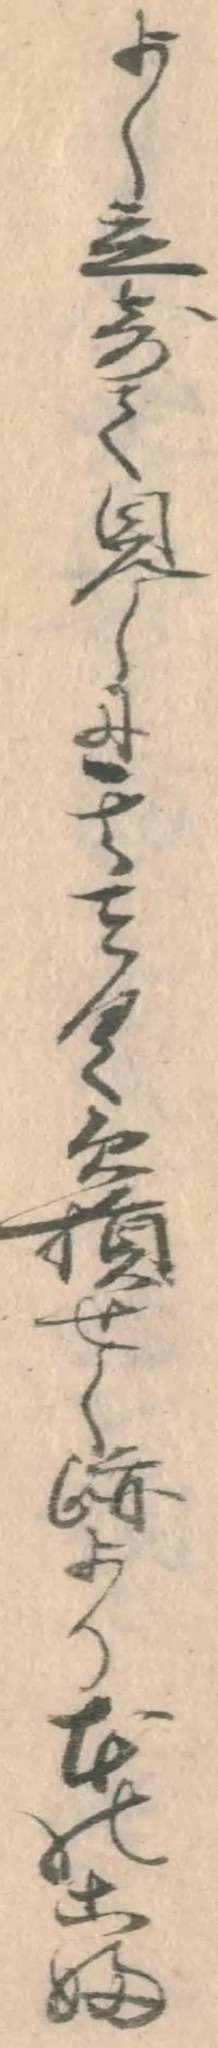よく立寄て見しにてことく欠損せし跡より本のこふ
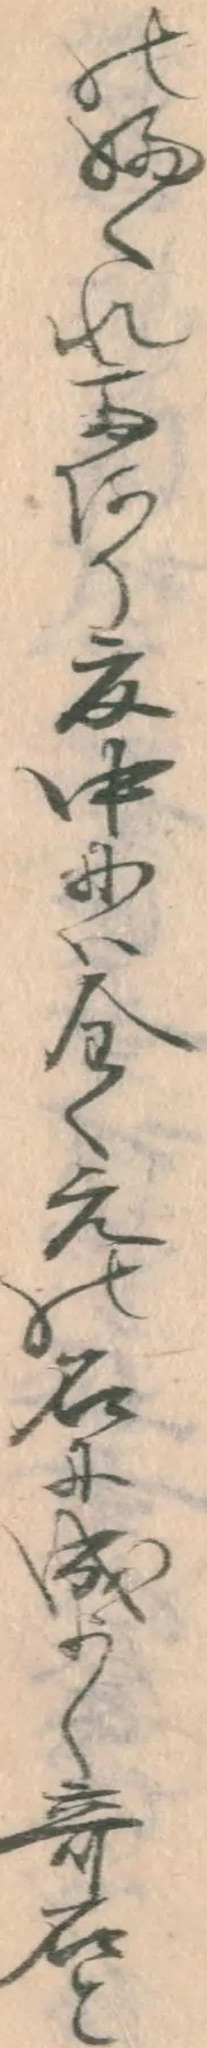のふくれてあり夏中には全く元の石に成よく奇石と
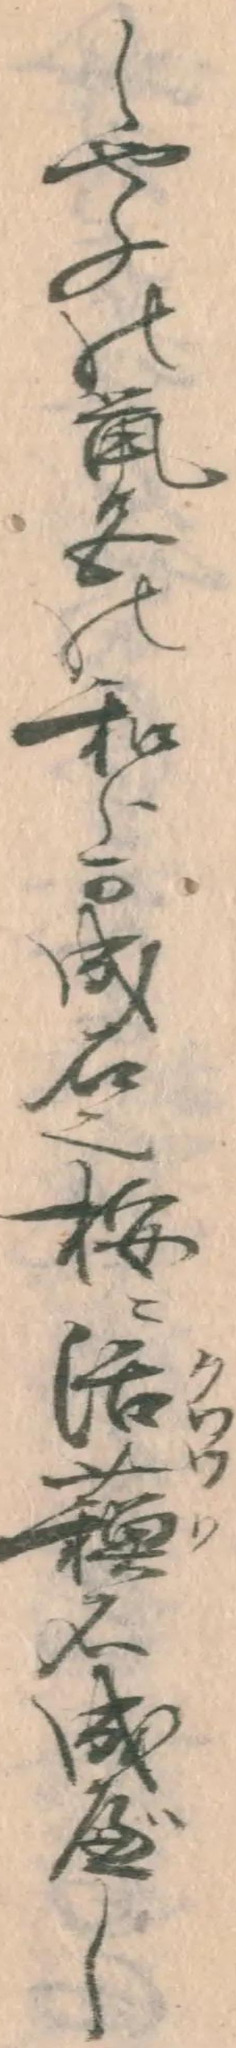しやふの鼠色の和らか成石也按に活蘇石成べし
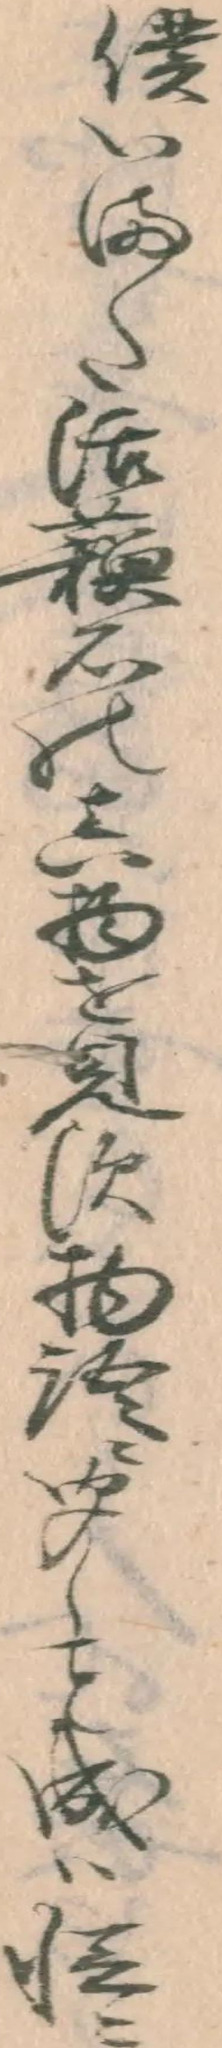僕いまた活蘇石の真物を見す物語に聞くこと成は慥に
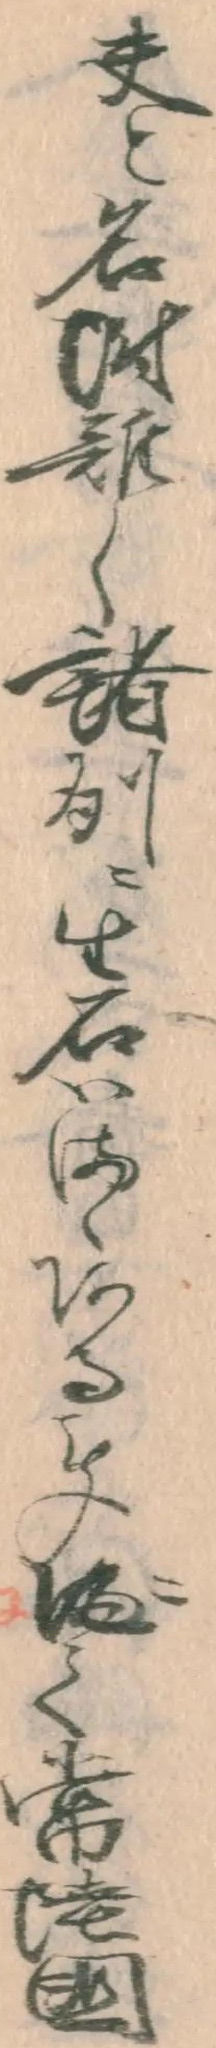夫と名附離し諸州に生石はまゝあるものにて常陸国
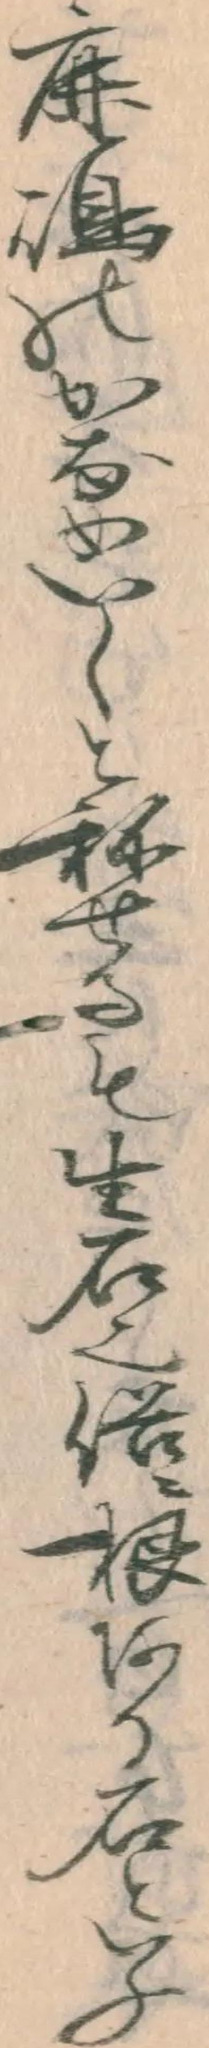鹿島のかなめいしと称せるも生石也俗に根あり石といふ
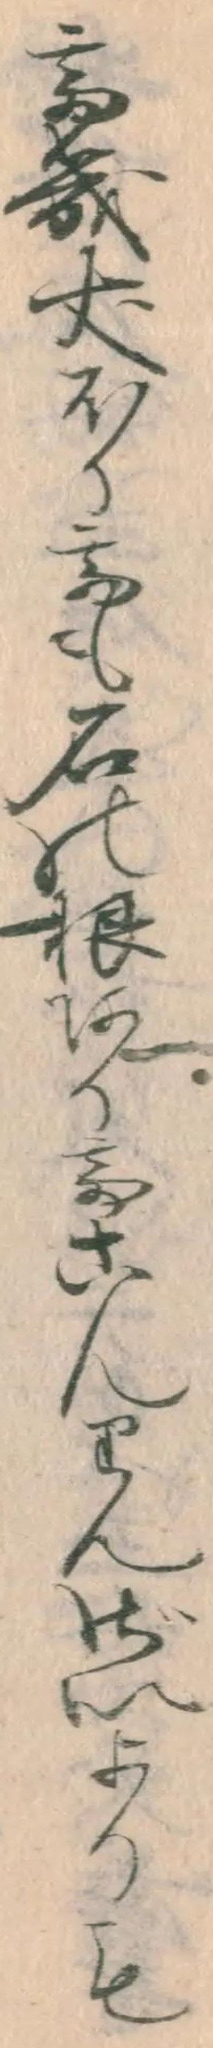高幾丈ほりても石の根ありてこんりんざいよりも
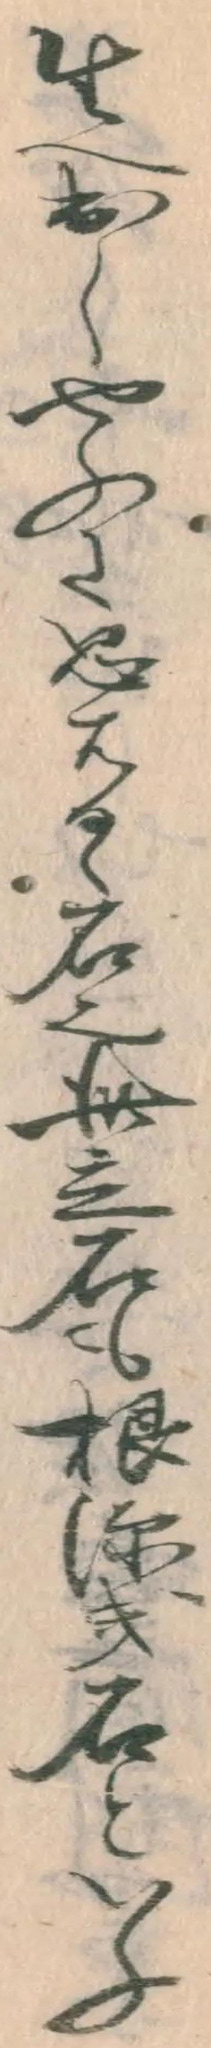生へ出しやふに思はるゝ石也此立石も根深き石といふ
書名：四神地名録 6巻. [4]葛飾郡
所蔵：国立国会図書館 National Diet Library, JAPAN
